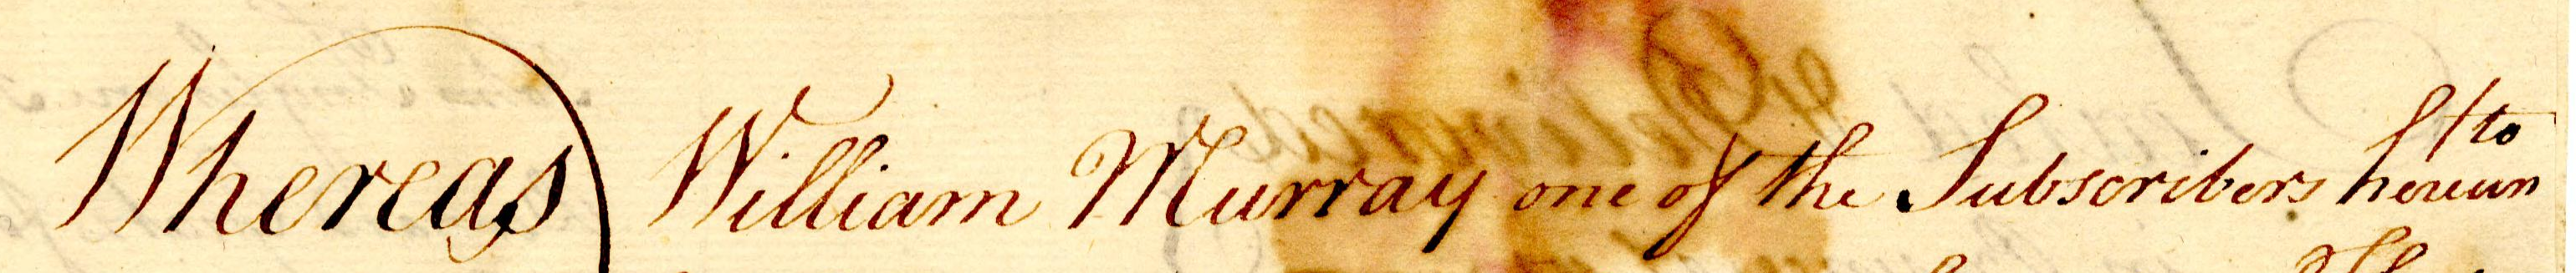Whereas William Murray one of the Subscriber hereunto
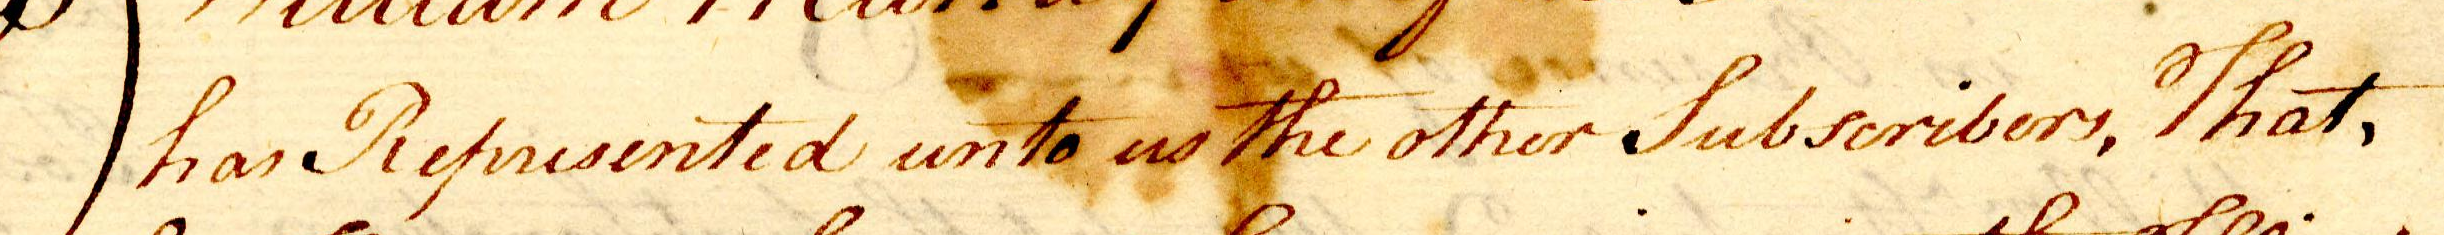has Represented unto us the other Subscribers, That,
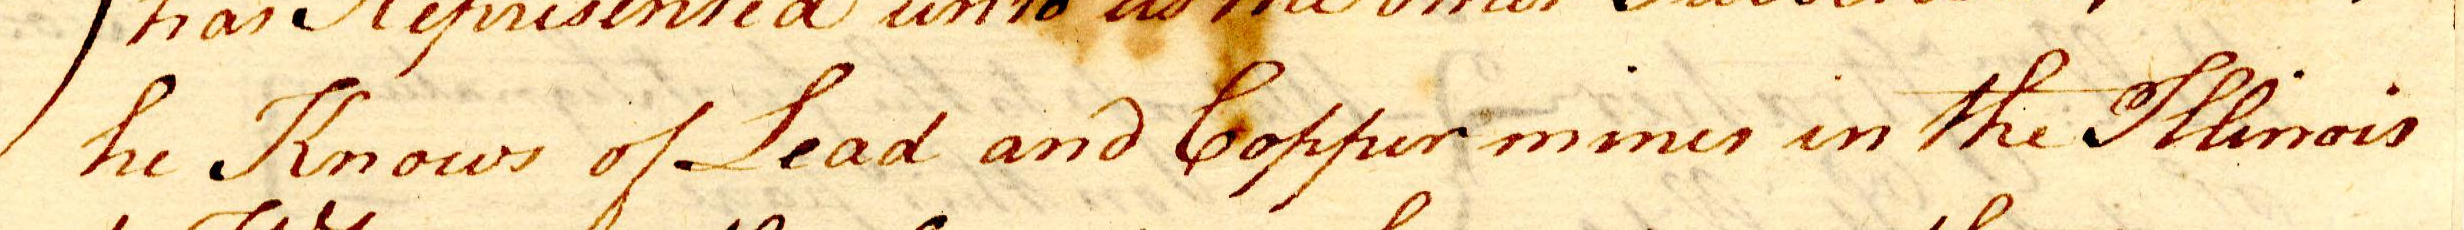he Knows of Lead and Copper mines in the Illinois
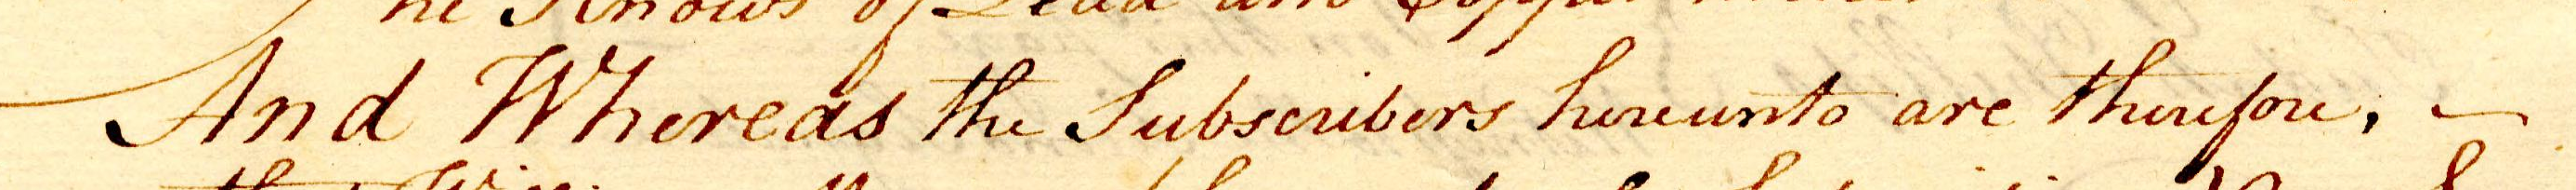And Whereas the Subscribers hereunto are therefore,
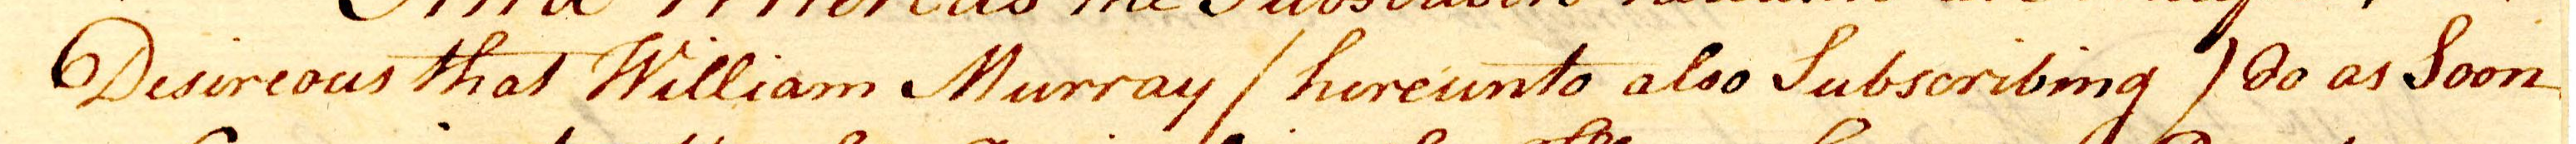Desireous that William Murray (hereunto also Subscribing) do as soon
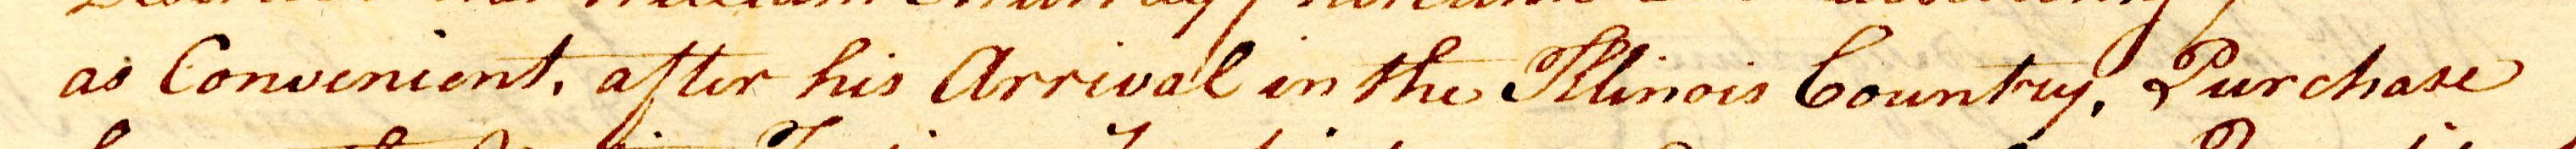as Convenient after his Arrival in the Illinois Country Purchase
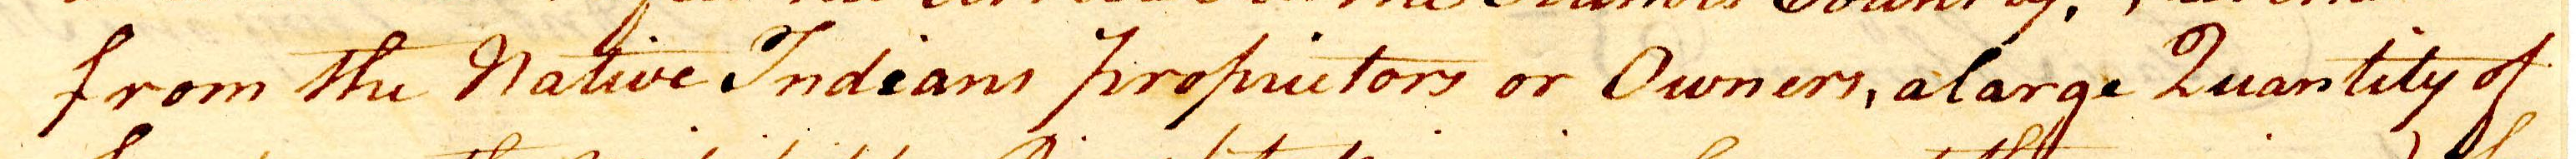from the Native Indians proprietors or Owners, a large Quantity of
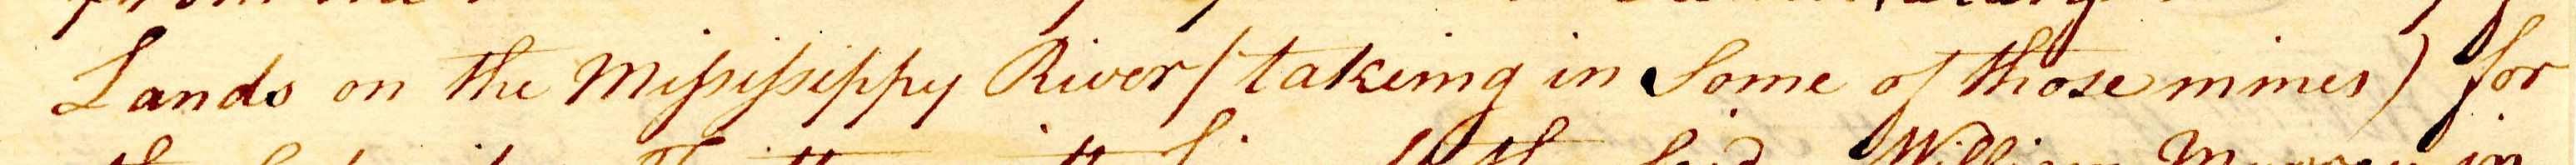Lands on the Misissippy River (taking in some of those mines) for
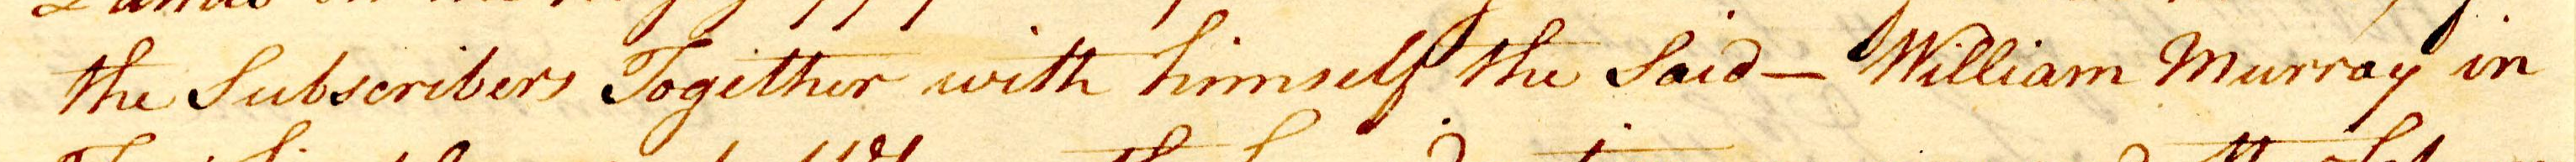the Subscribers Together with himself the Said- William Murray in
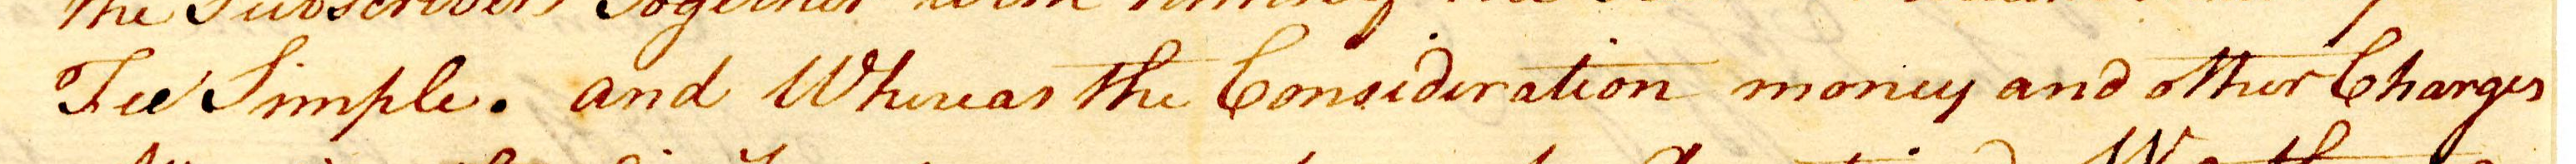Fee Simple. and Whereas the Consideration money and other Charges
